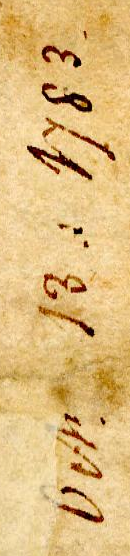Oct 13. 1783.
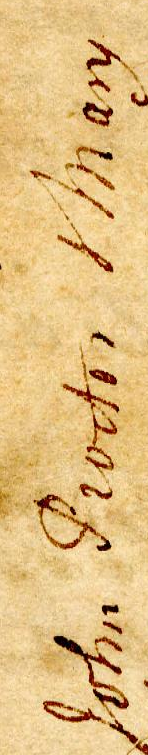John Proctor, & Mary
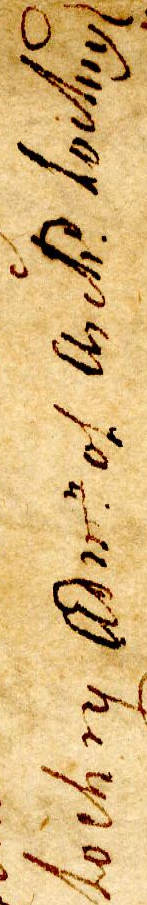Lochry Adm^n. of Arch^d. Lochry
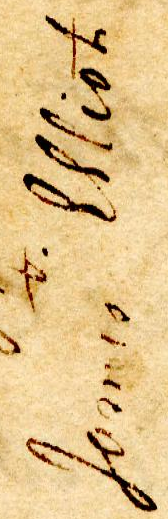James Elliot
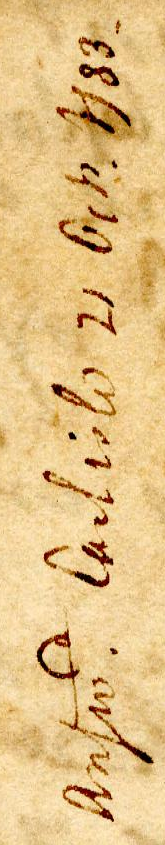Answ^d. Carlisle 21 Oct^r. 1783
